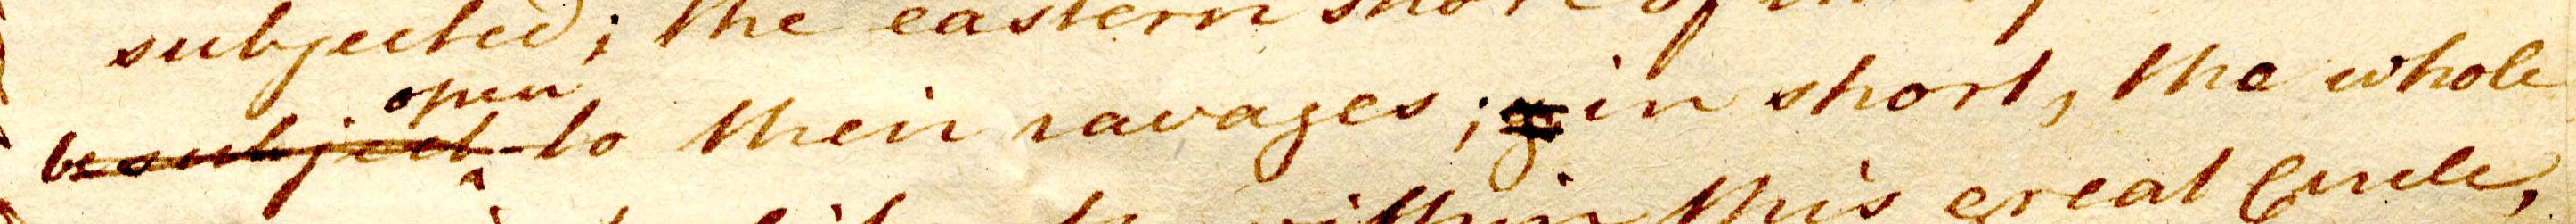[be subject] to their ravages; [&] in short, the whole
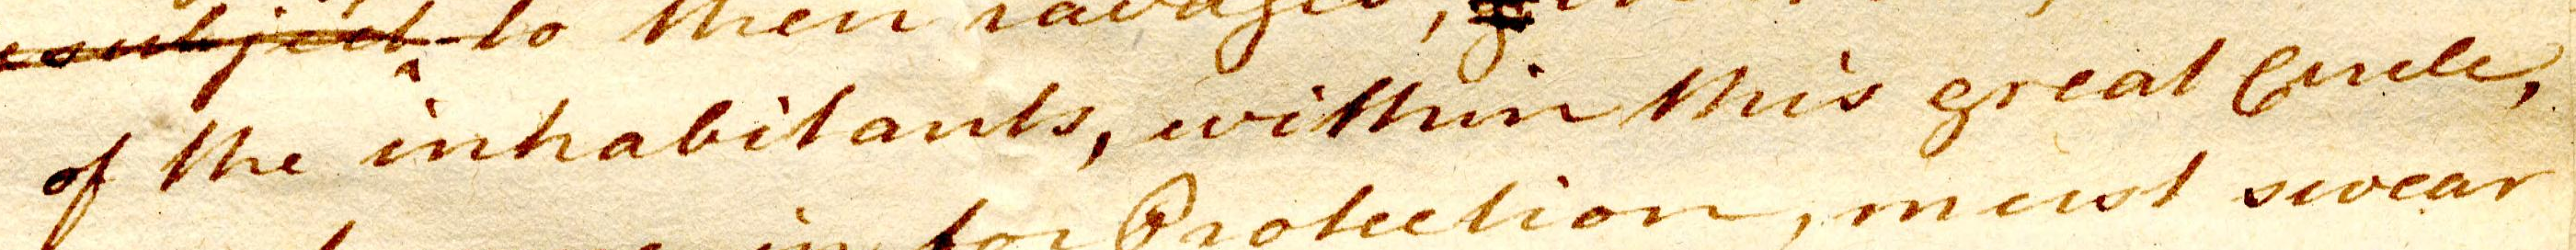of the inhabitants, within this great Circle,
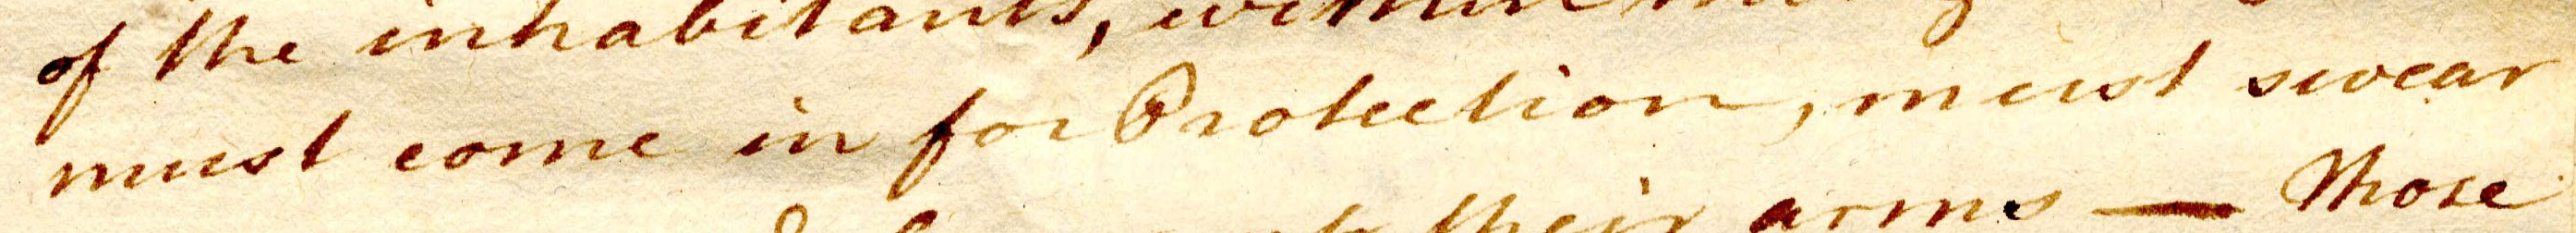must come in for Protection, must sevear
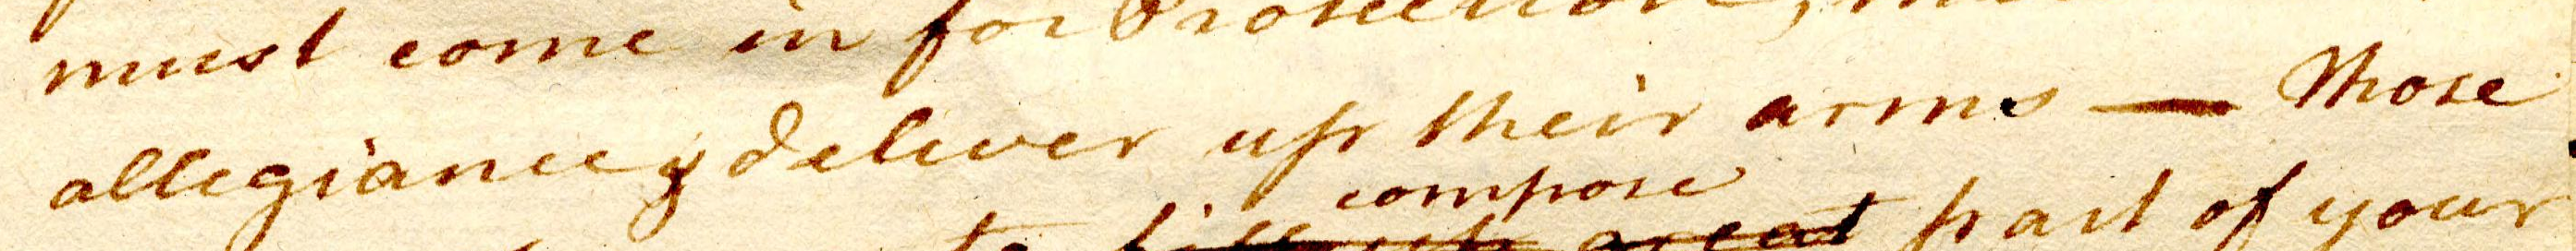allegiance & deliver up their arms- those
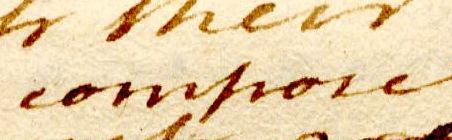compose
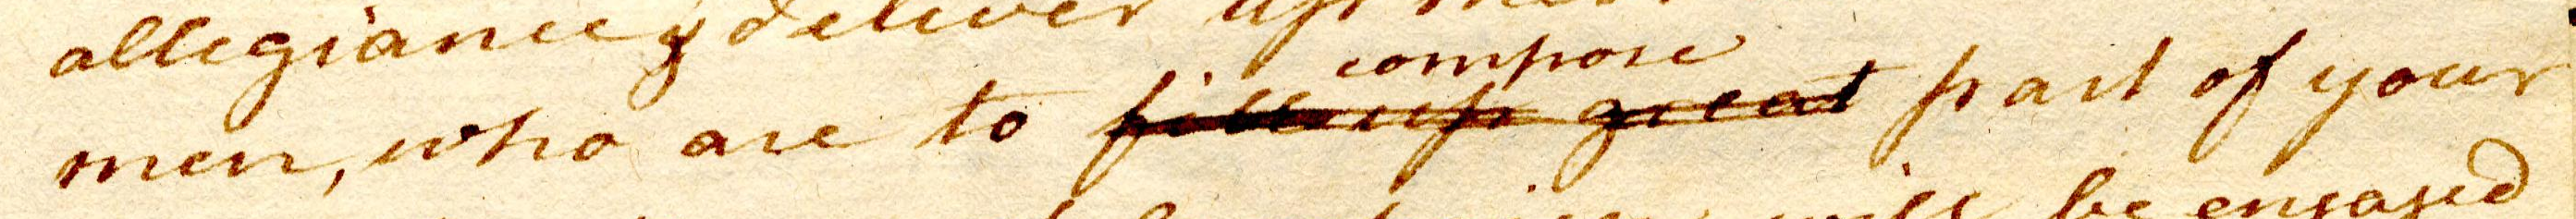men, who are to [fill up great] part of your
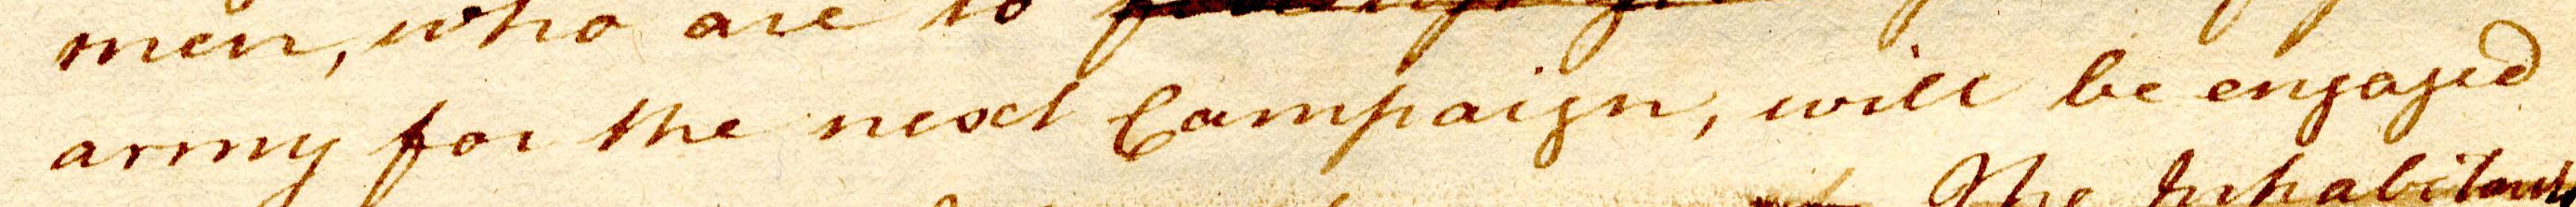army for the next Campaign, will be engajed
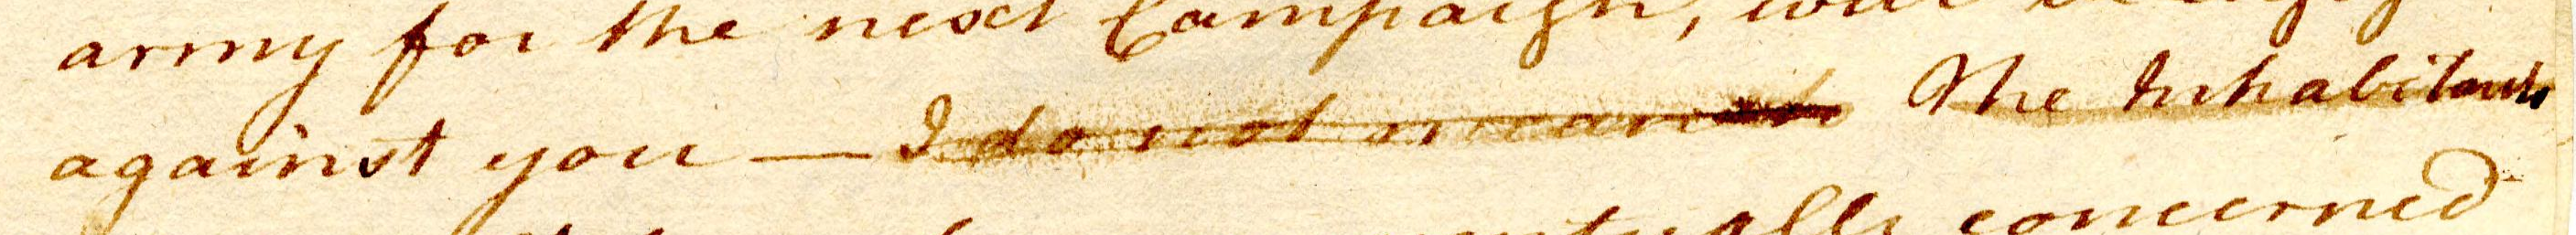against you- [I do not ______] the Inhabitants
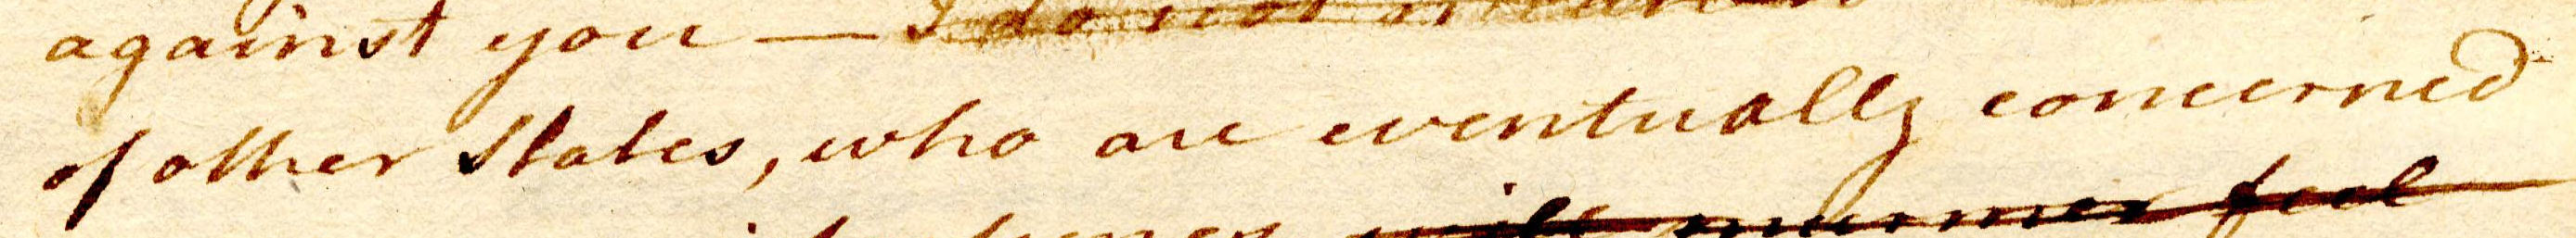of other states, who are eventually concerned
